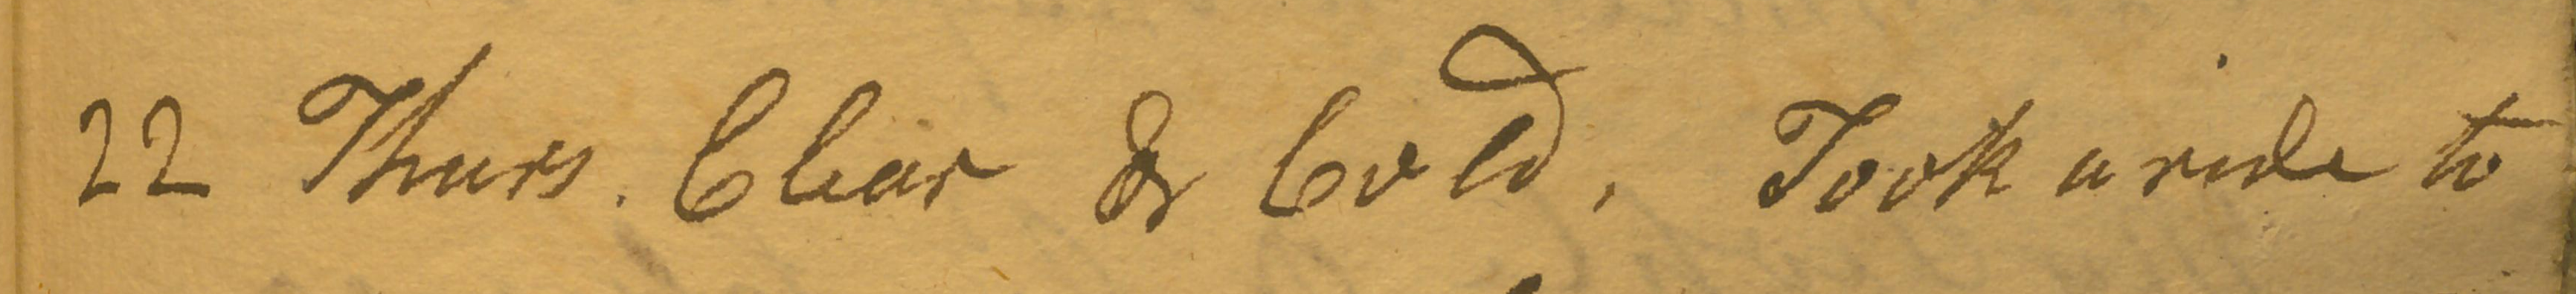22 Thurs. Clear & Cold, Took a ride to
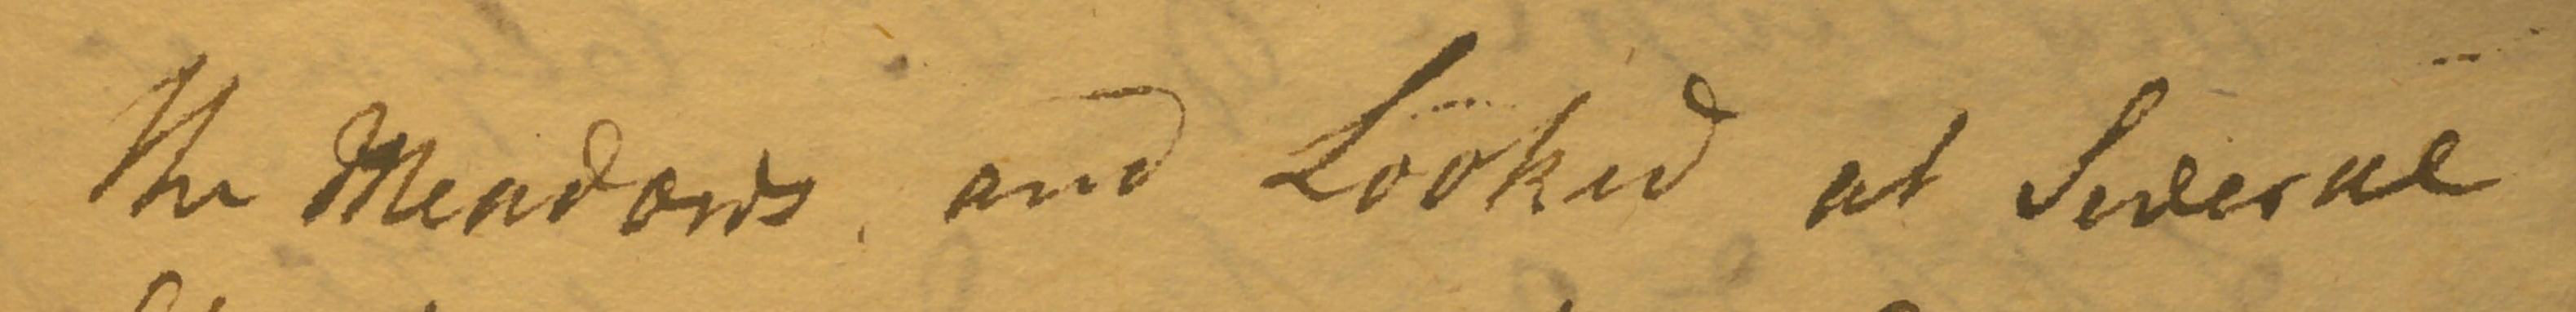the Meadows and Looked at Several
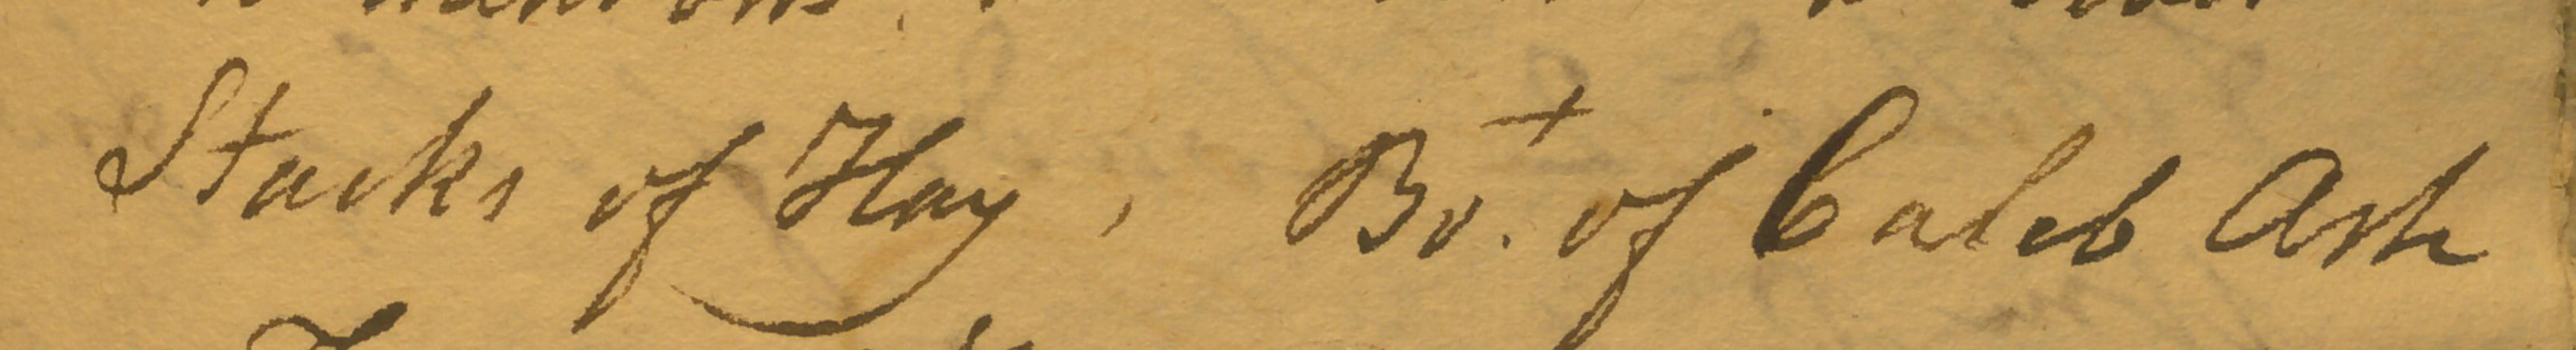Stacks of Hay. Bo^t. of Caleb Ash
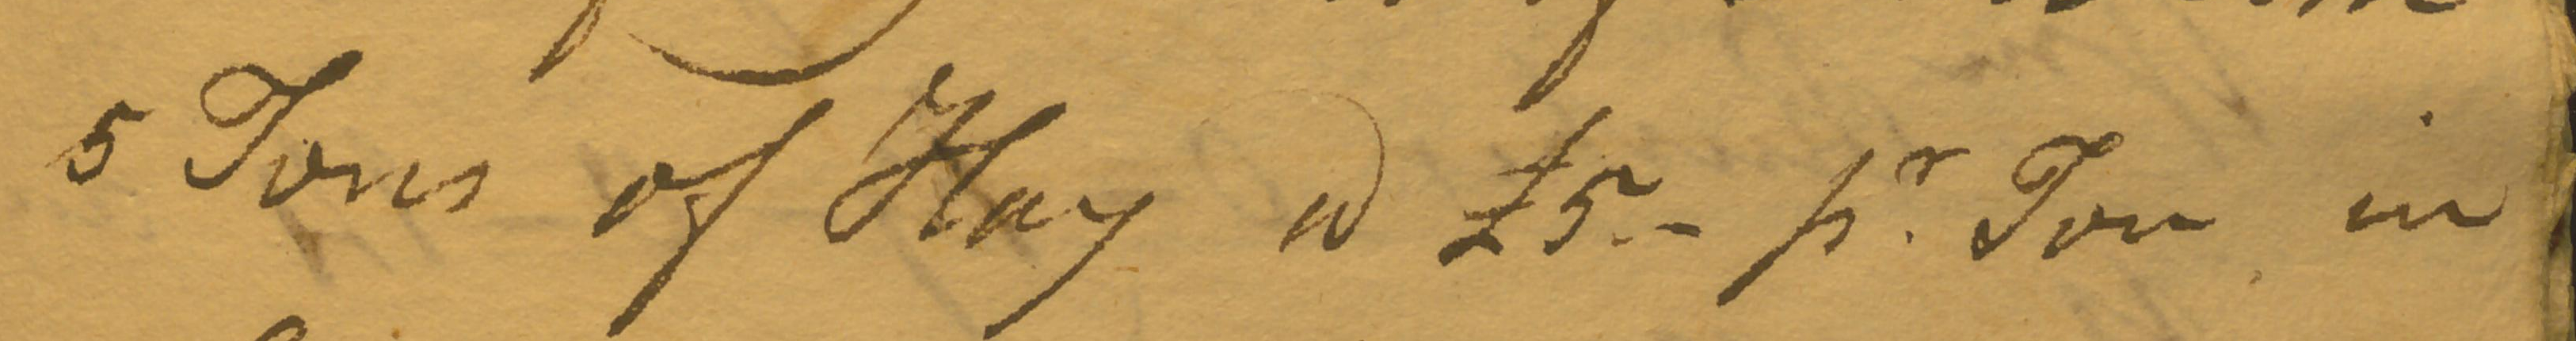5 Tons of Hay @ £5. p^r. Ton in
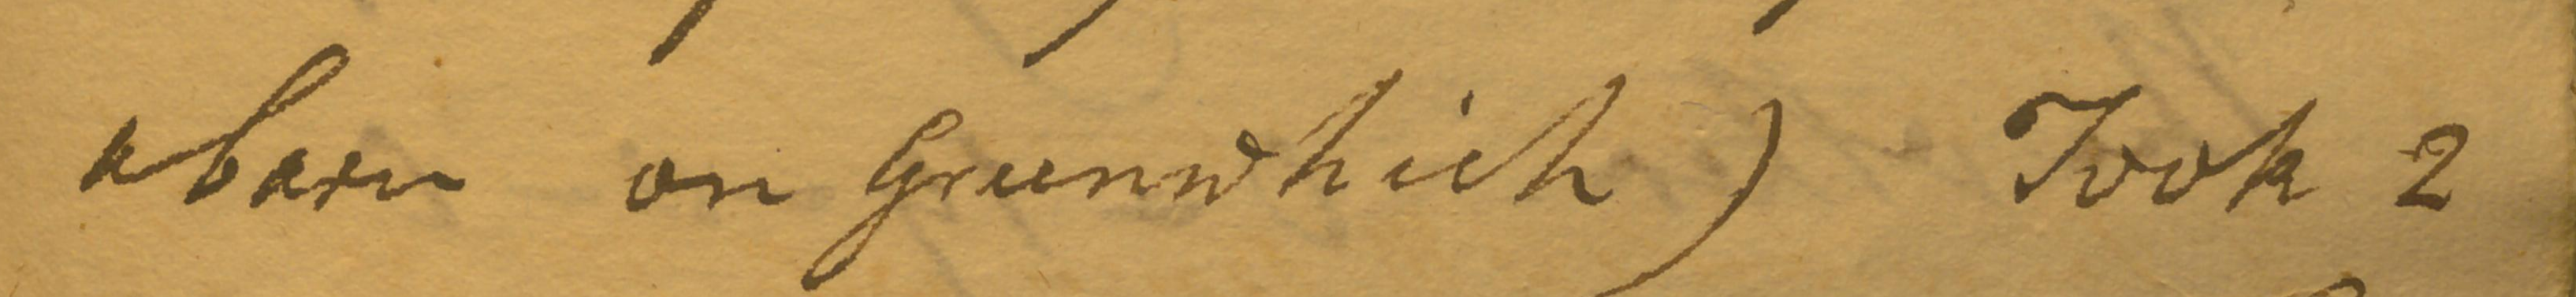a barn on Greenwhich) Took 2
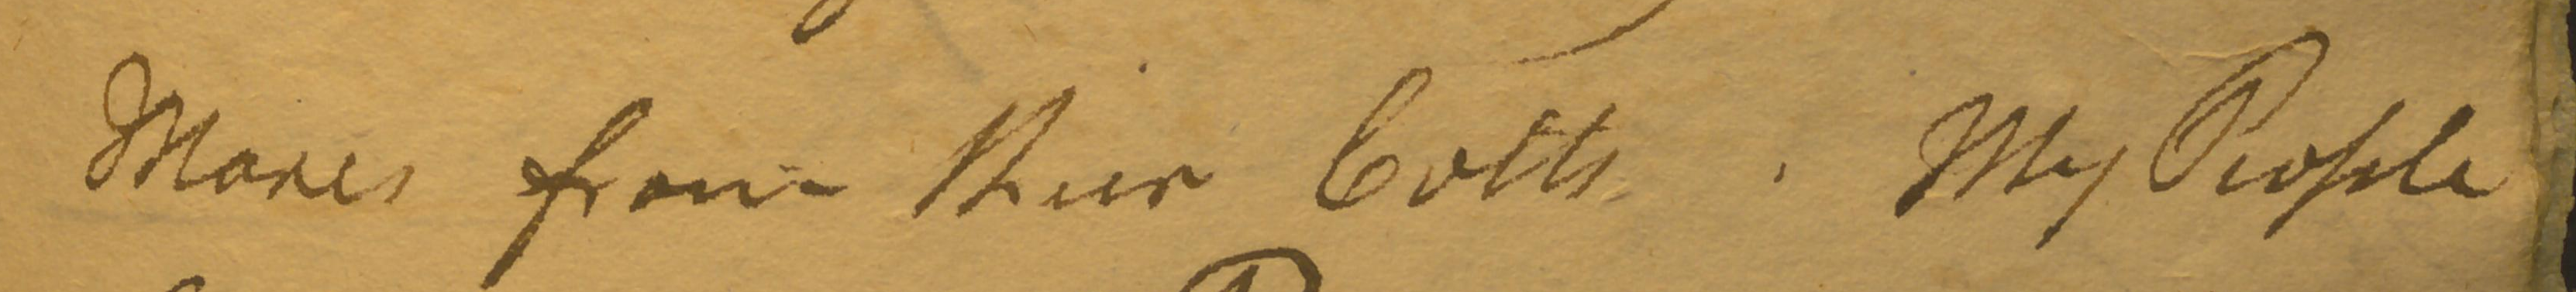Mares from their Colts. My People
